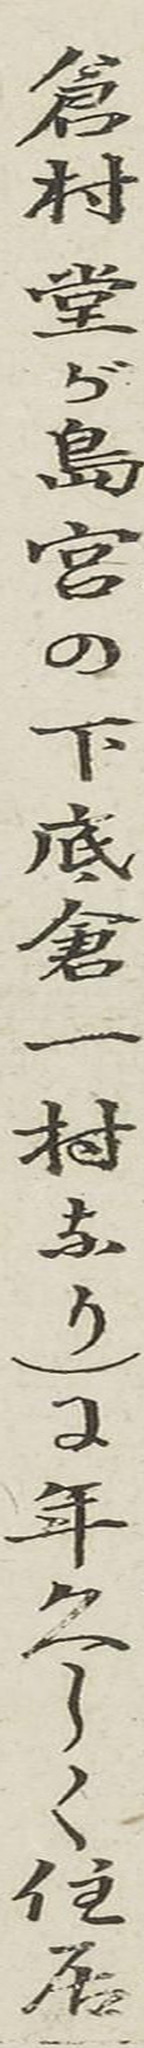倉村堂が島宮の下底倉一村なり）に年久しく住居
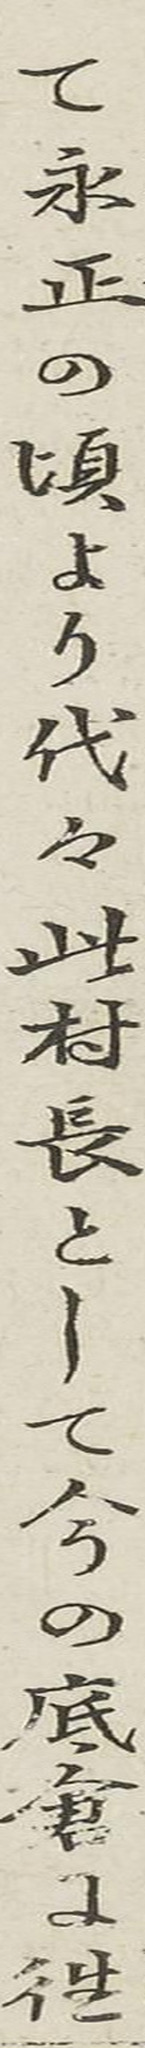て永正の頃より代々此村長として今の底倉に往
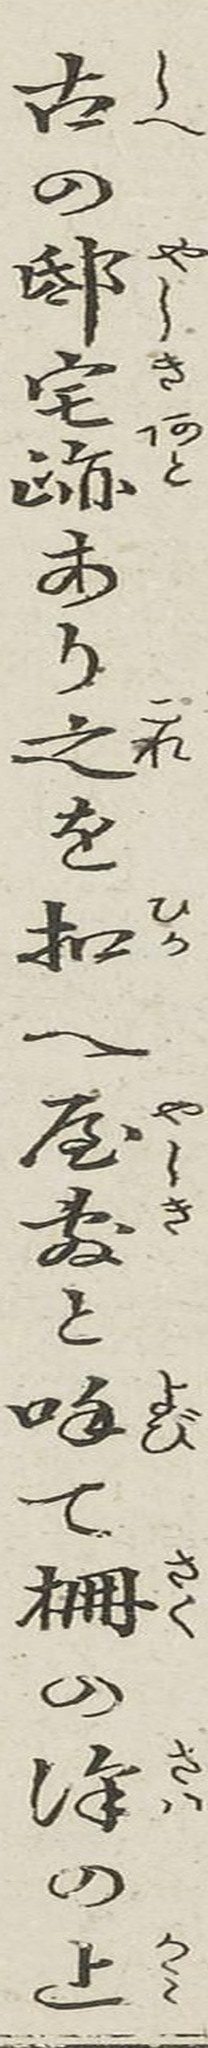古の邸宅跡あり之を扣へ屋敷と呼て柵の際の上
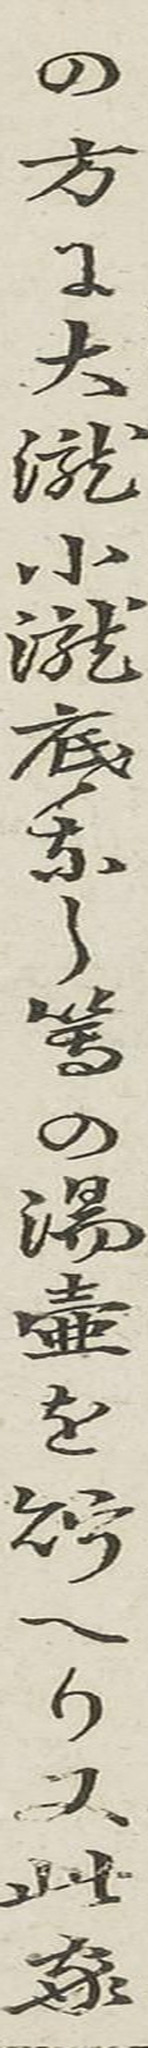の方に大瀧小瀧底なし等の湯壺を貯へりに此家
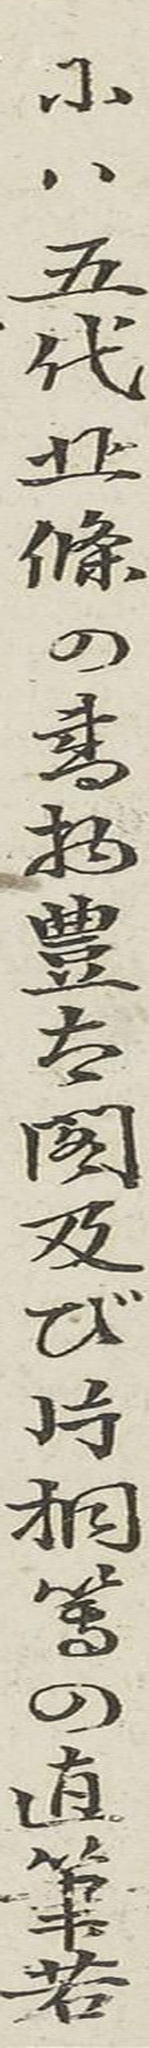には五代北条の書物豊太閤及び片桐等の直筆若
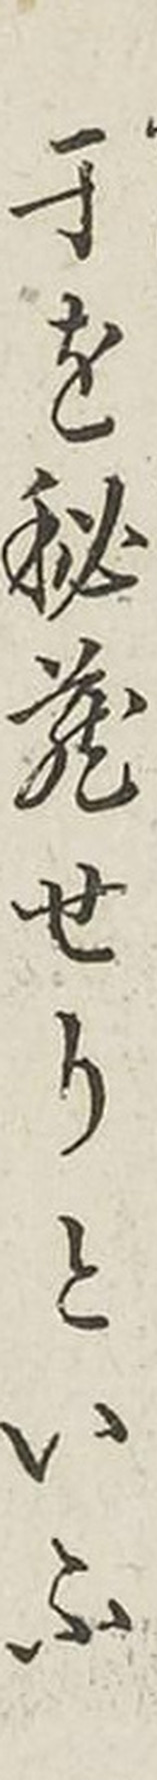干を秘蔵せりといふ
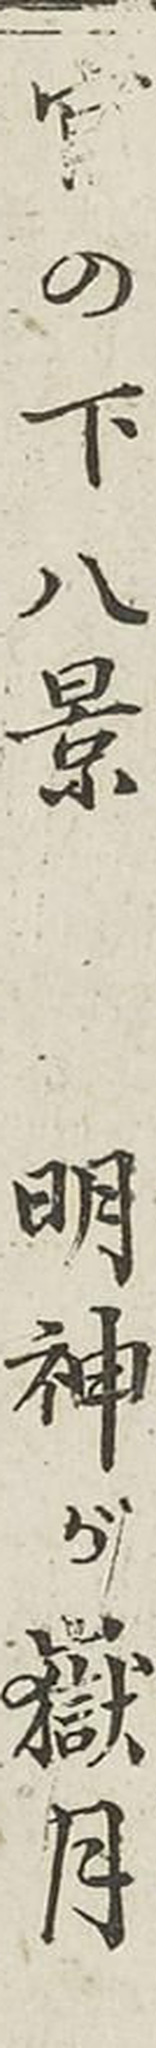宮の下八景明神が嶽月
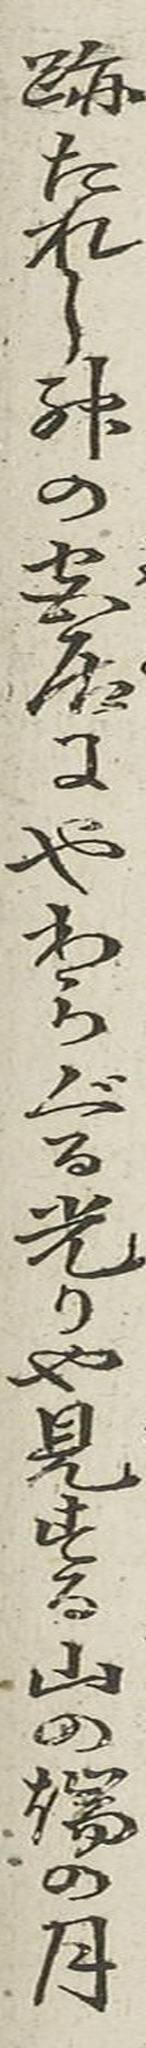跡たれし神の宮居にやわらぐる光り見する山の端の月
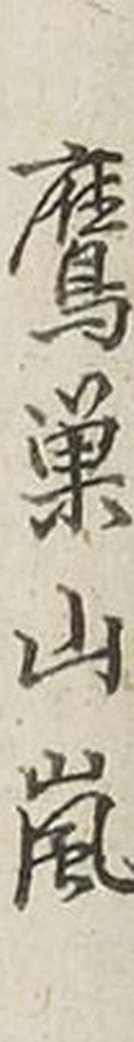鷹巣山嵐
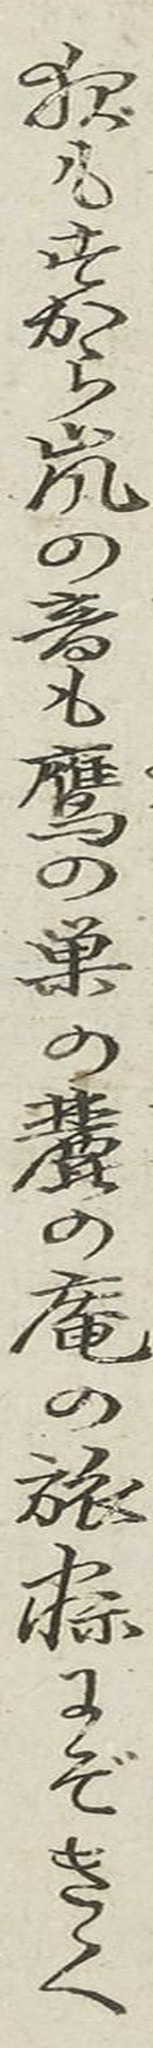夜もすから嵐の音も鷹の巣の麓の庵の旅寝にぞきく
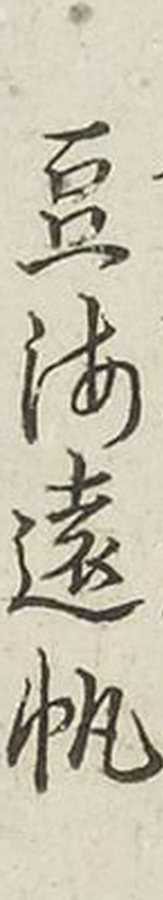豆海遠帆
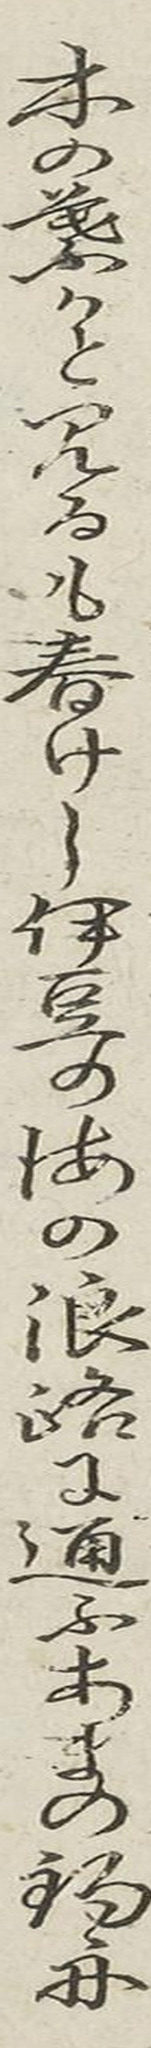木の葉かと見るも春けし伊豆の海の浪路に通ふあまの釣舟
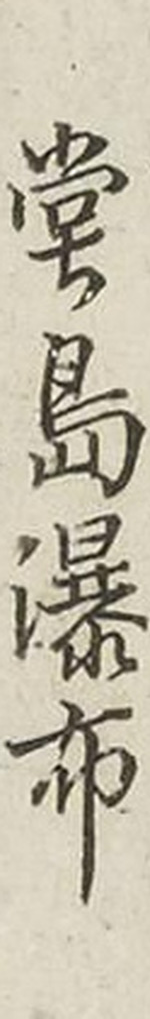堂島瀑布
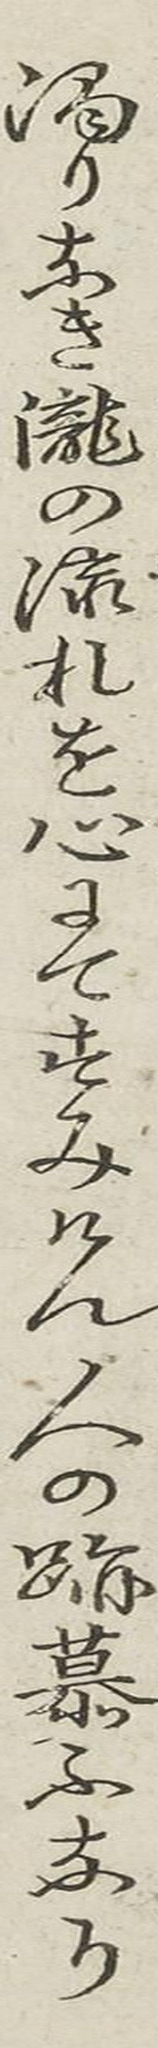濁りなき瀧の流れを心にてすみけん人の跡慕ふなり
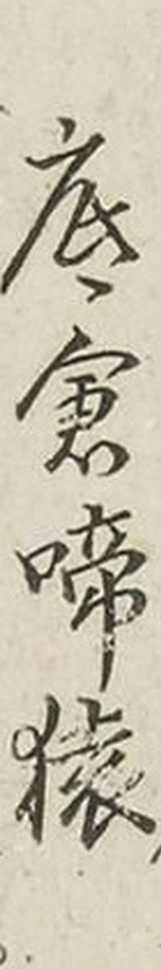底倉啼猿
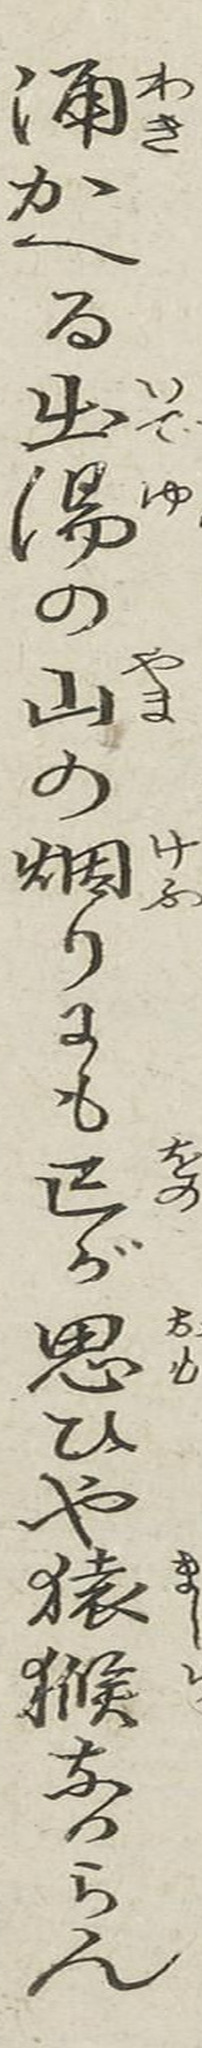湧きかへる出湯の山の烟りにも己が思ひや猿猴なくらん
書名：箱根温泉誌　全
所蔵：東京大学地震研究所図書室 Earthquake Research Institute Library, The University of Tokyo, JAPAN
